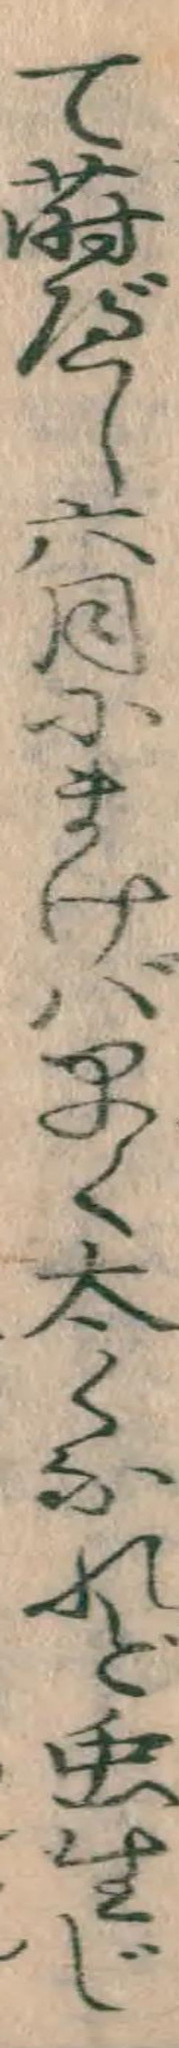て蒔べし六月にまけば早く太くなれど虫生じ
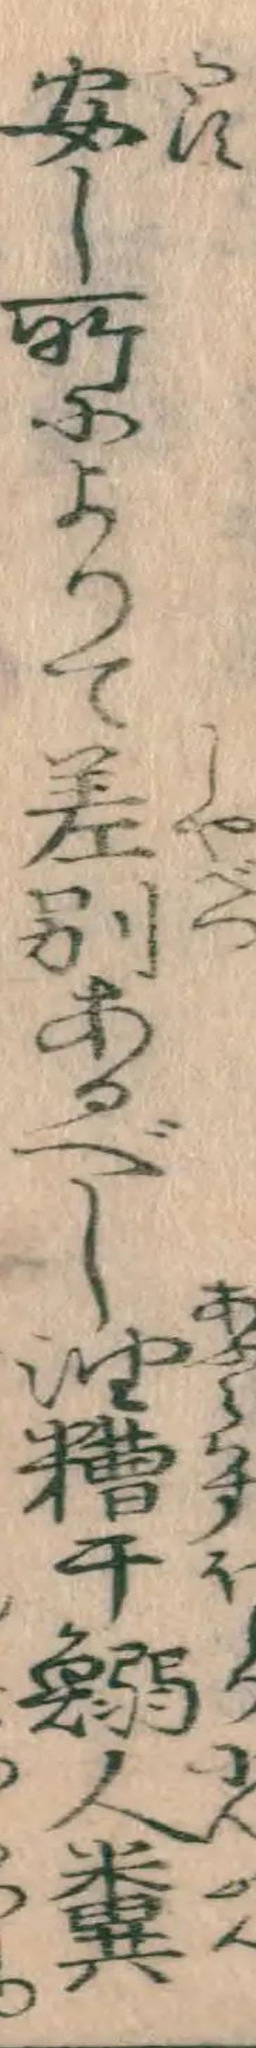安し所によりて差別あるべし油糟干鰯人糞
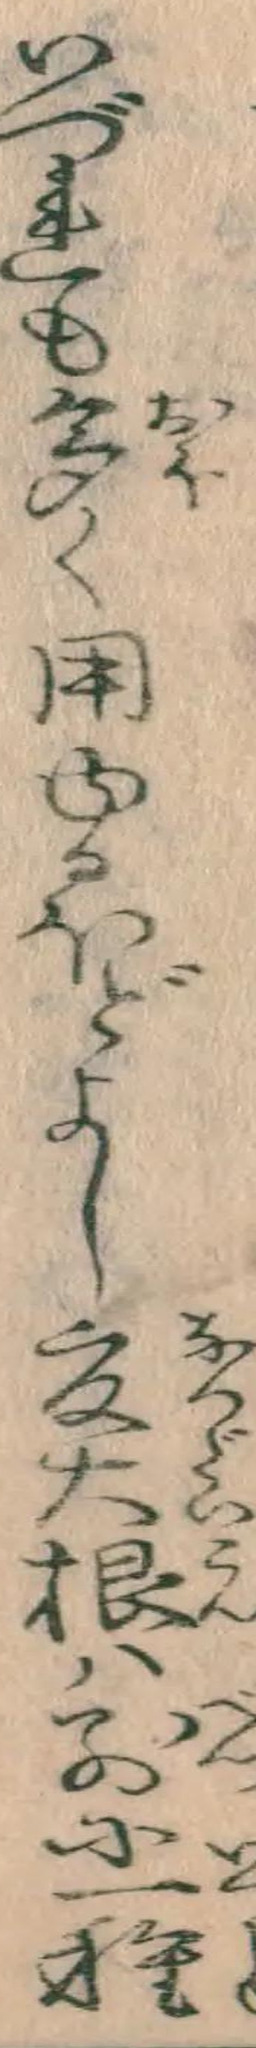いづれも多く用ゆるほどよし夏大根は別に一種
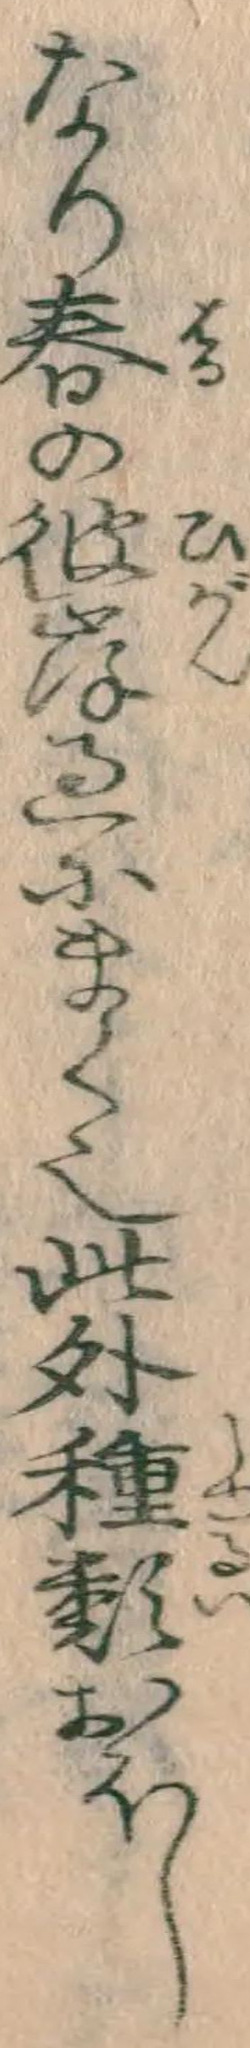なり春の彼岸過にまく也此外種類おほし
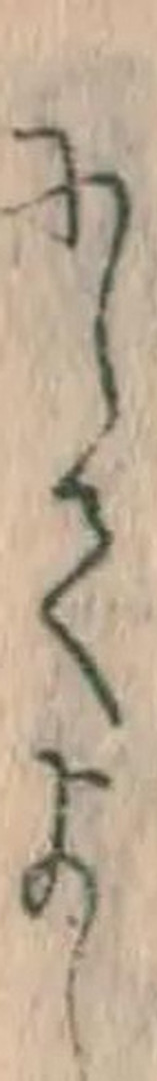にしてよし
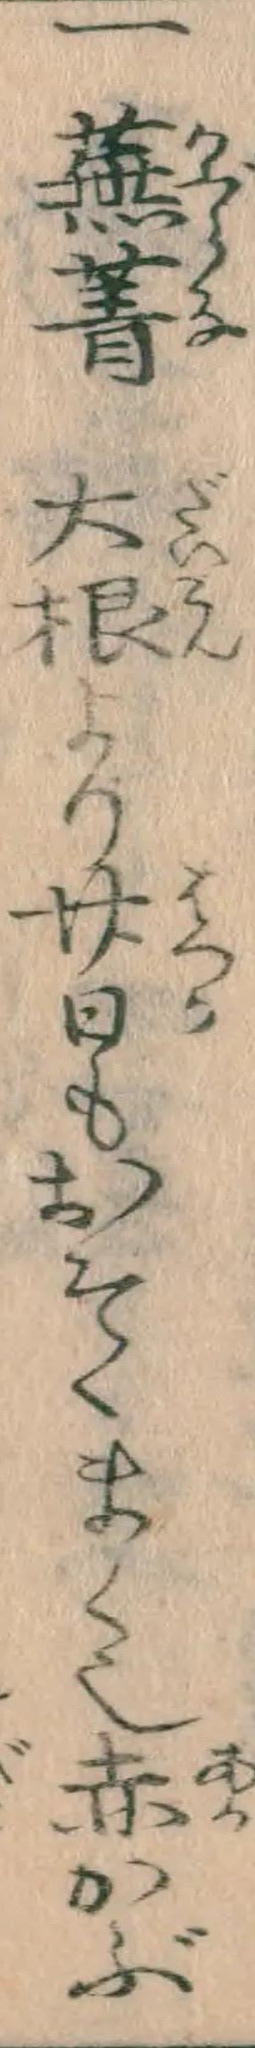一蕪菁大根より廿日もおそくまく也赤かぶ
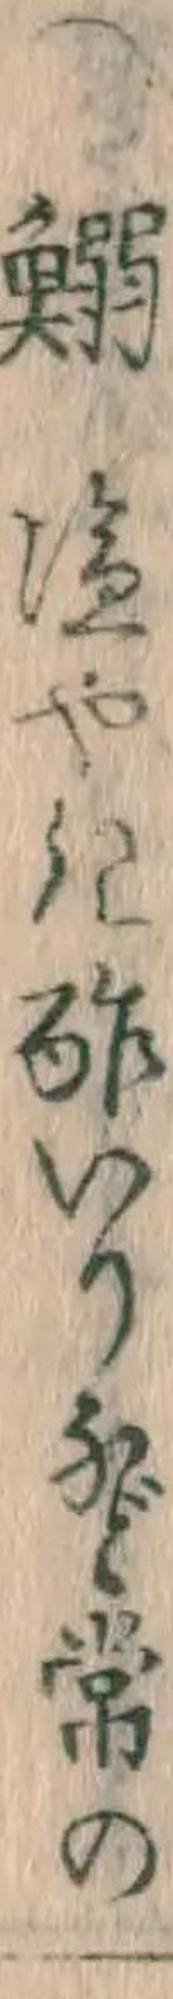○鰯塩やき酢いりなど常の
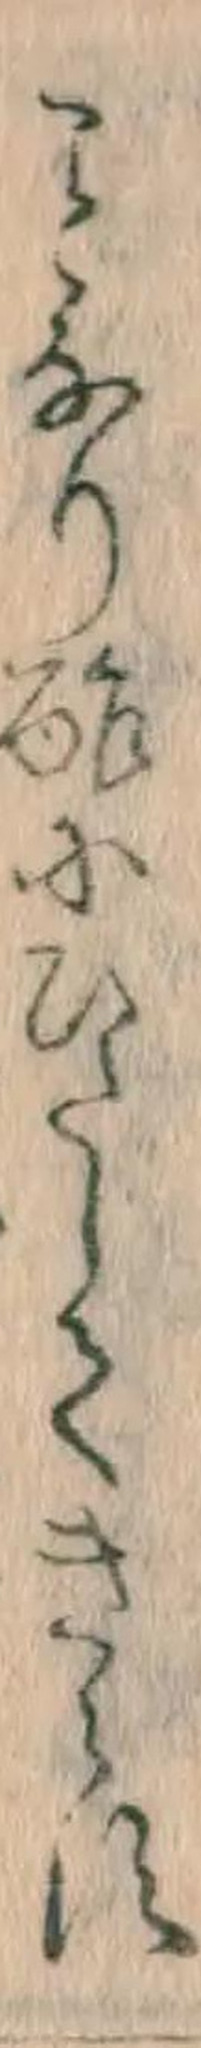ことなり酢にひたしてきらす
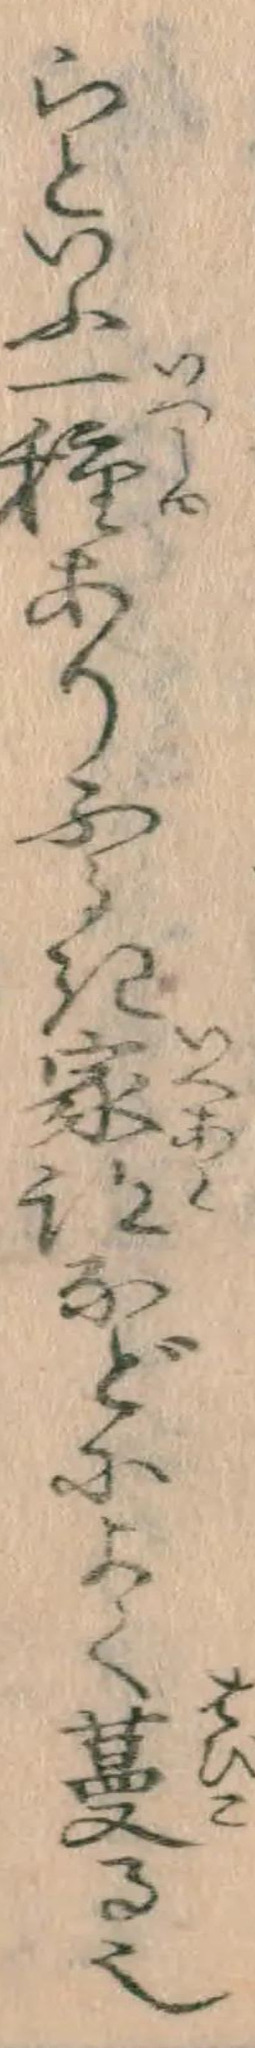らといふ一種ありふるき家跡などによく蔓る也
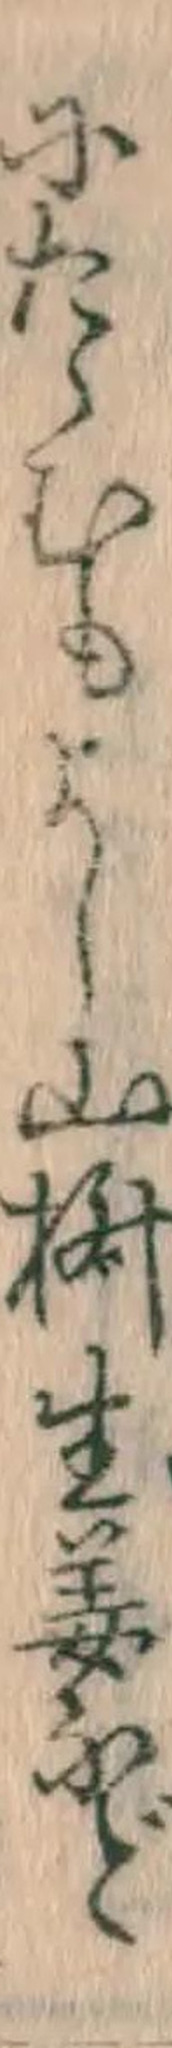にたゝむもよし山椒生姜など
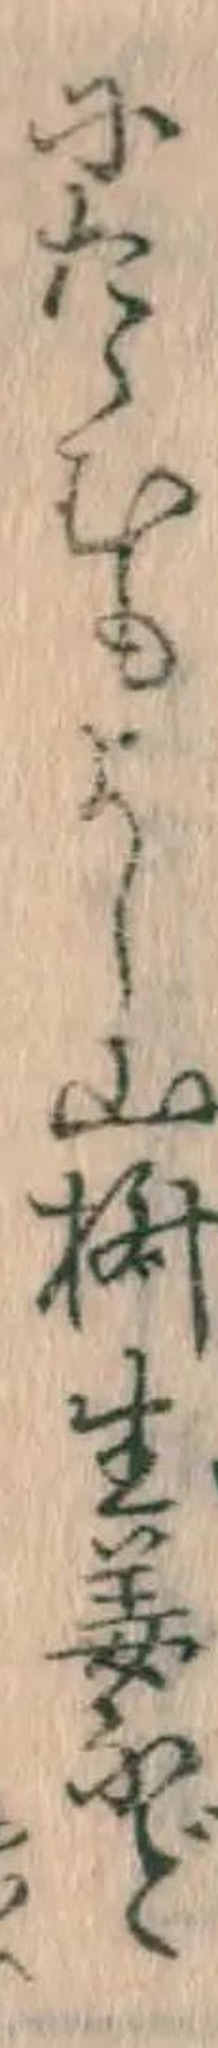にたゝむもよし山椒生姜など
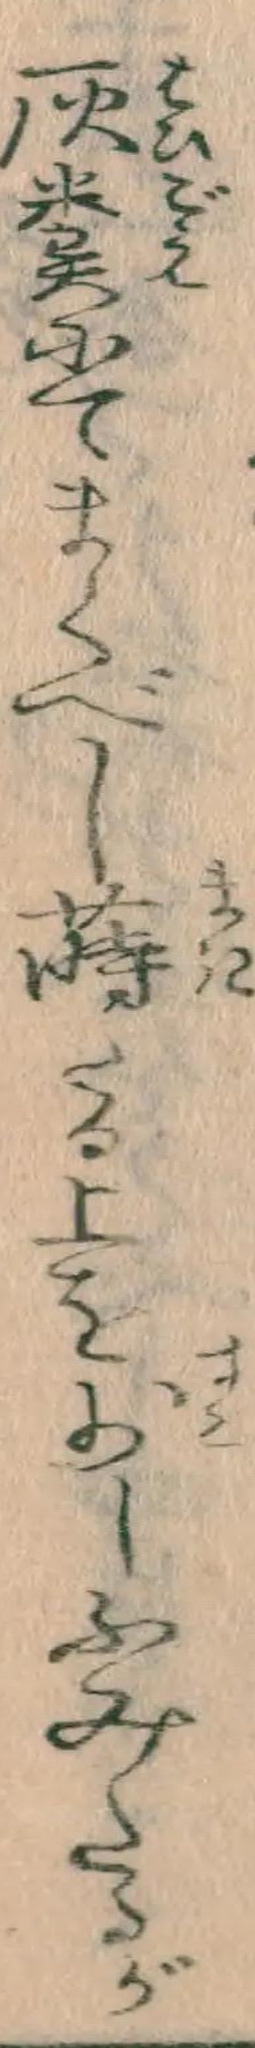灰糞にてまくべし蒔たる上を少しふみたるが
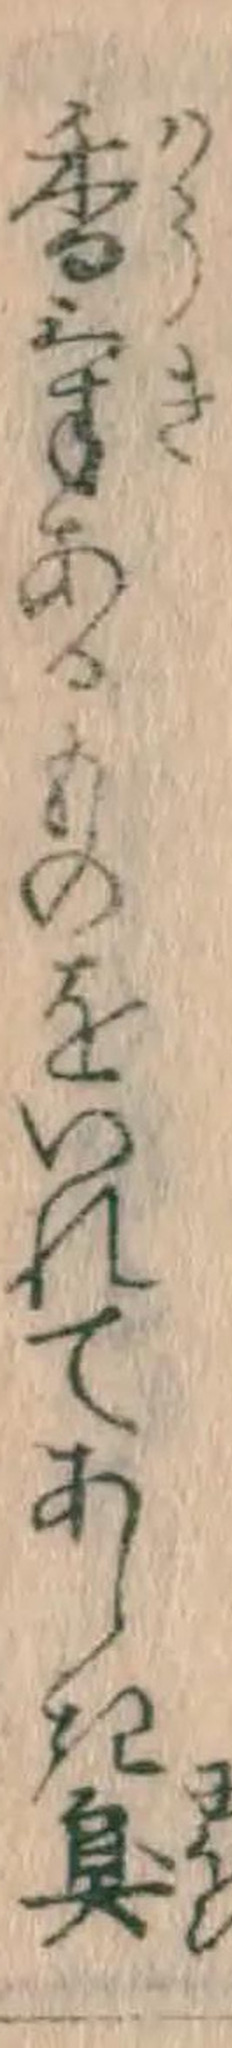香気あるものをいれてあしき臭
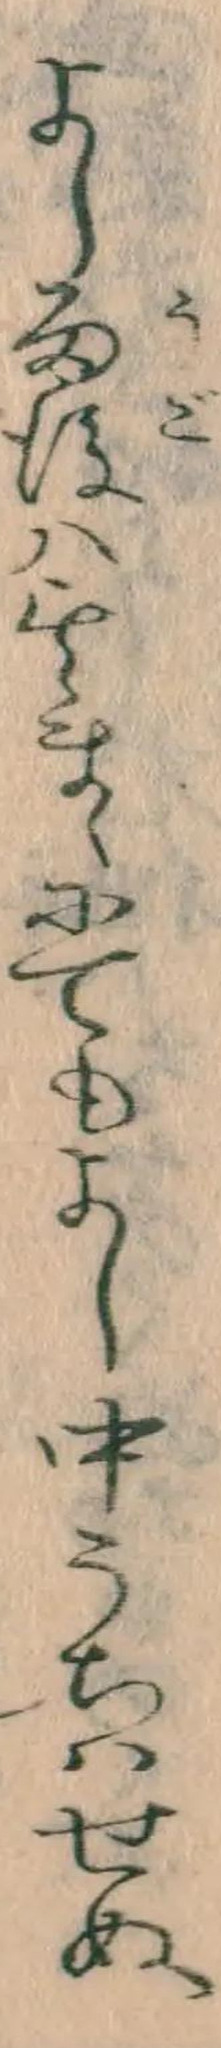よし雨後は其まゝにてもよし中うちはせぬ
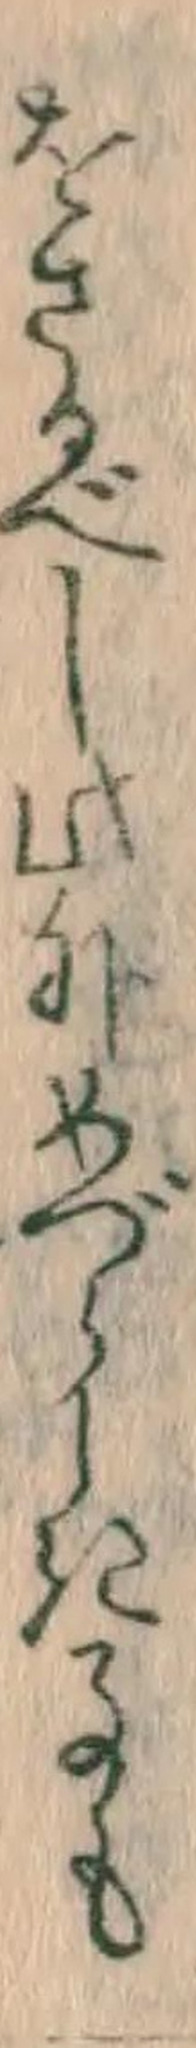をさるべし此外めづらしき事も
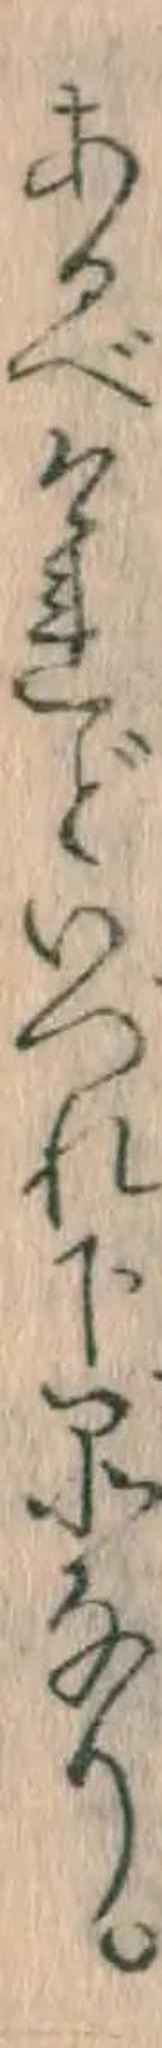あるべけれどいづれ下品なり。
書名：広益秘事大全 3巻. [5]
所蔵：国立国会図書館 National Diet Library, JAPAN
